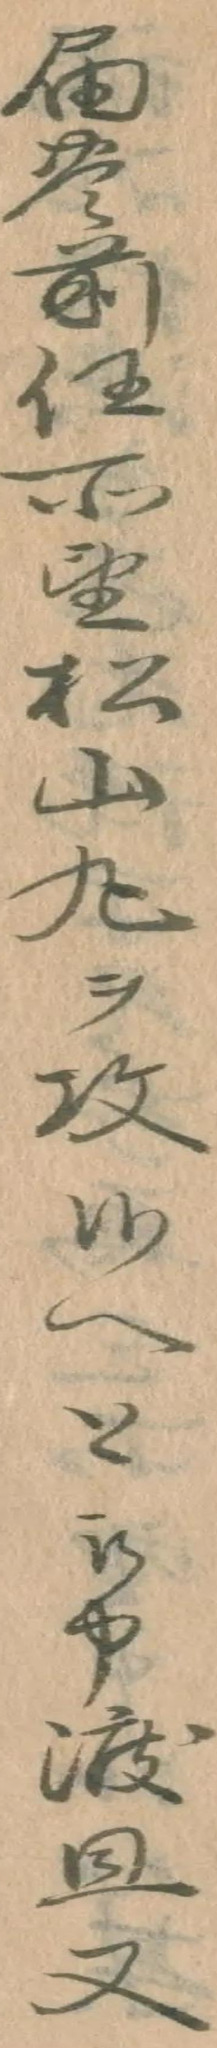届豊前任所望松山丸を攻候へと被申渡且又
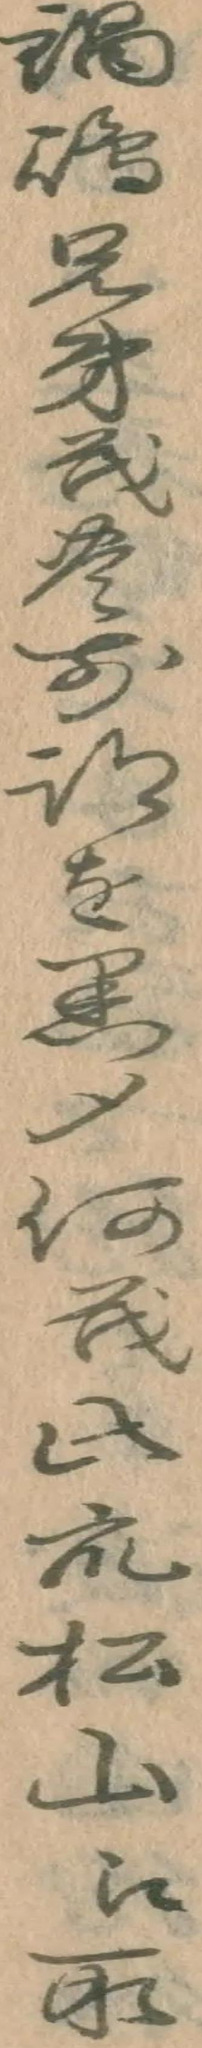鍋島兄弟茂豊前跡を黒め何茂此衆松山江取
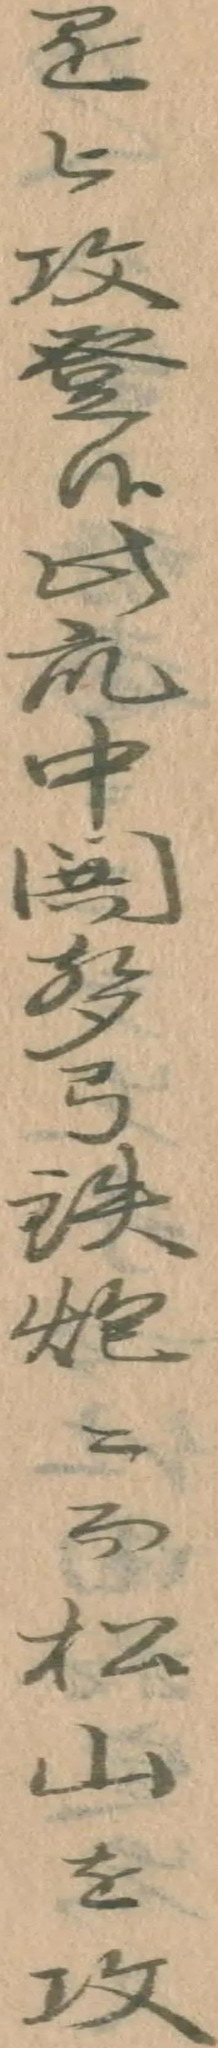懸被攻登候此衆中鬨声弓鉄炮に而松山を攻
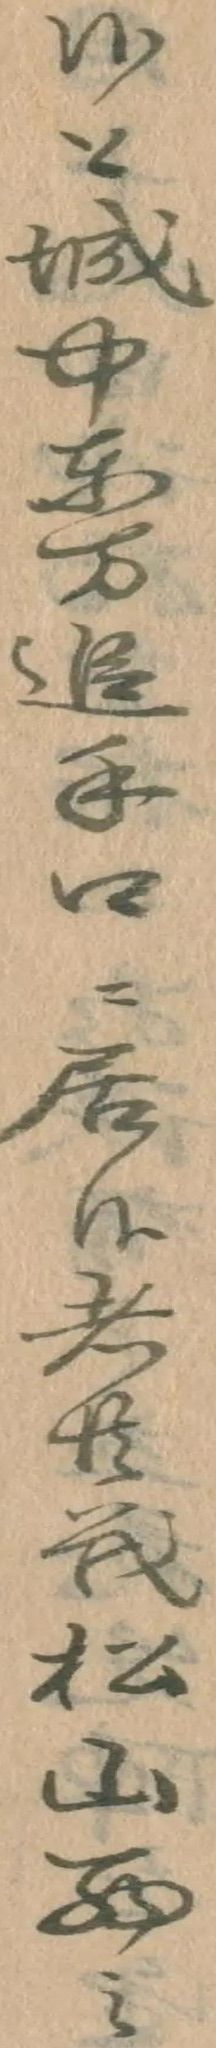候と城中東方追手口に居候者共茂松山西之
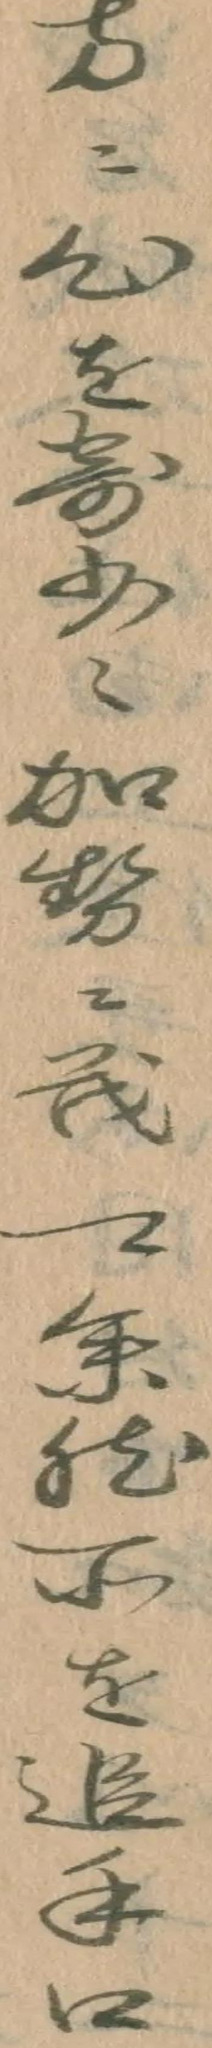方に心を寄少々加勢に茂可参然所を追手口
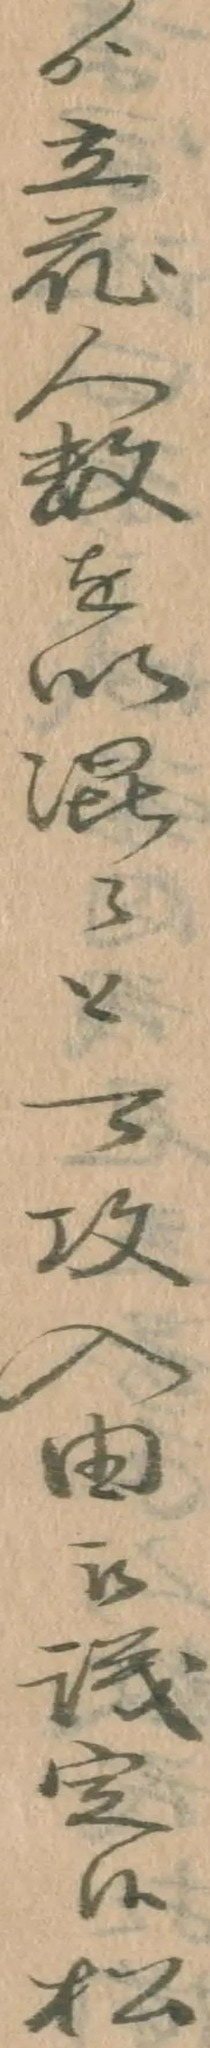ゟ立花人数を以混々と可攻入由被議定候松
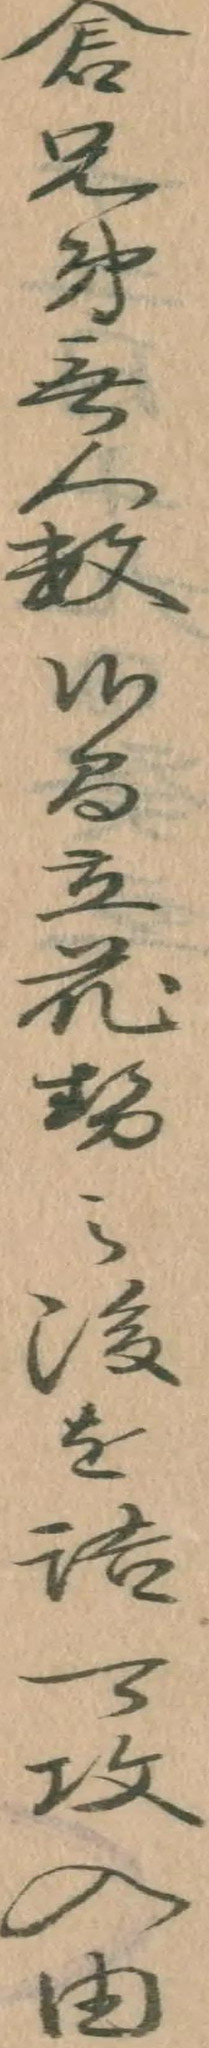倉兄弟無人数候間立花勢之後を詰可攻入由
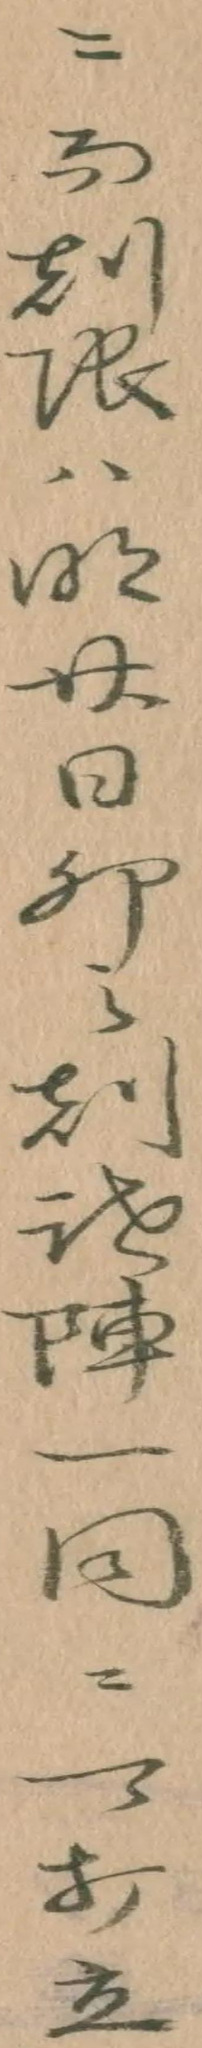に而刻限は明廿日夘之刻諸陣一同に可打立
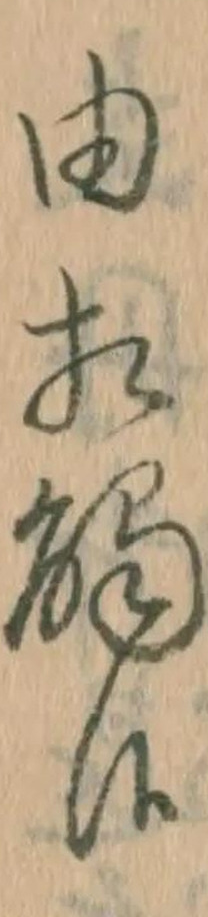由相觸候
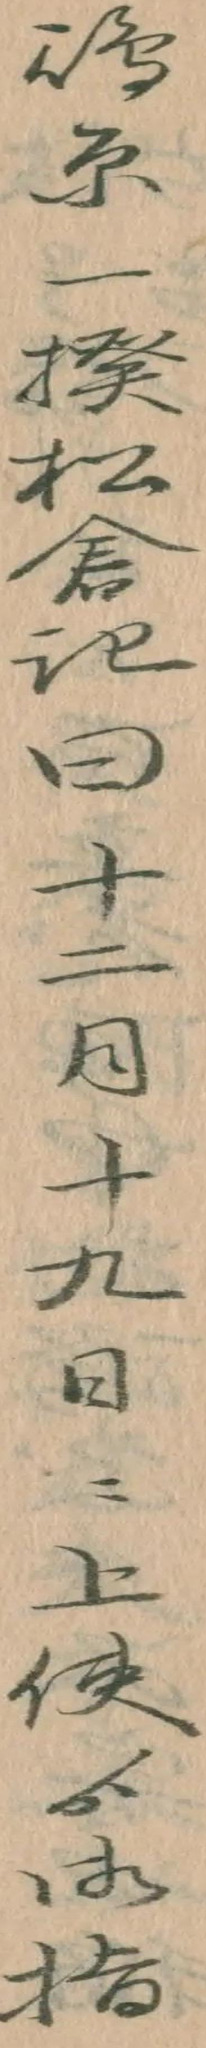島原一揆松倉記曰十二月十九日に上使ゟ御指
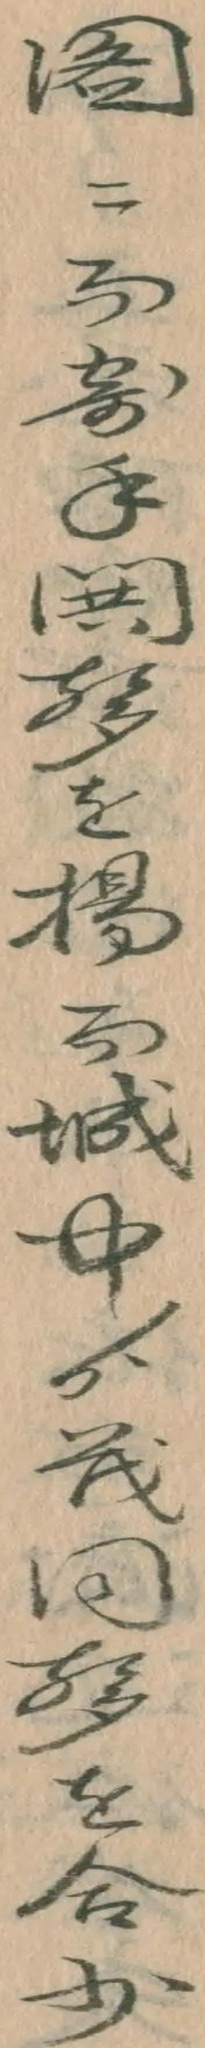図に而寄手鬨声を揚而城中ゟ茂同声を合少
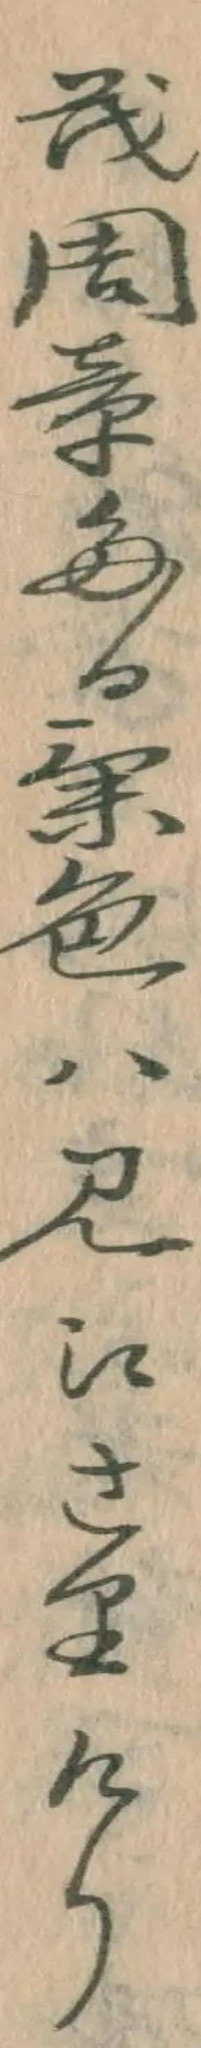茂周章多る気色は見江さ里けり
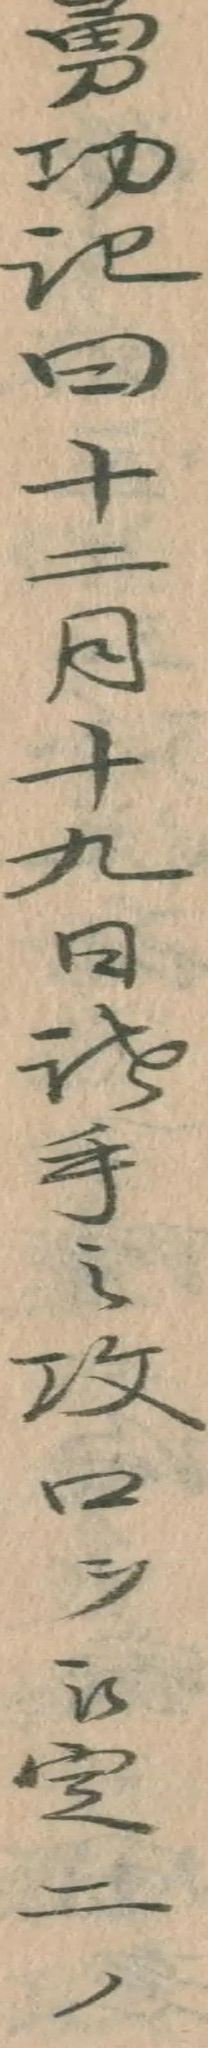勇功記曰十二月十九日諸手之攻口を被定二之
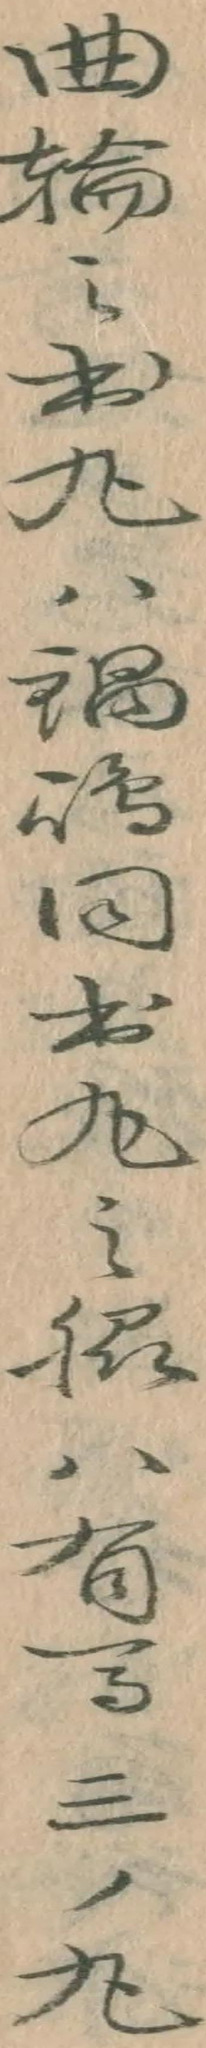曲輪之出丸は鍋島同出丸之脇は有馬三之丸
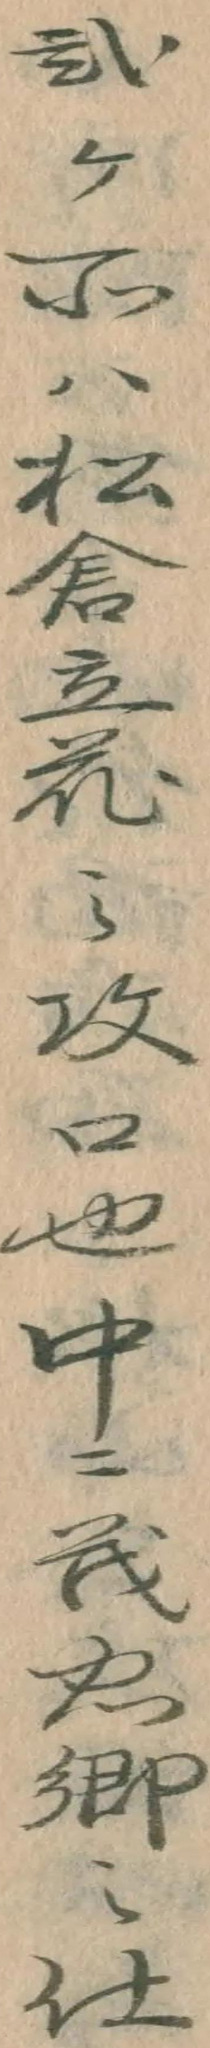弐け所は松倉立花之攻口也中に茂忠郷之仕
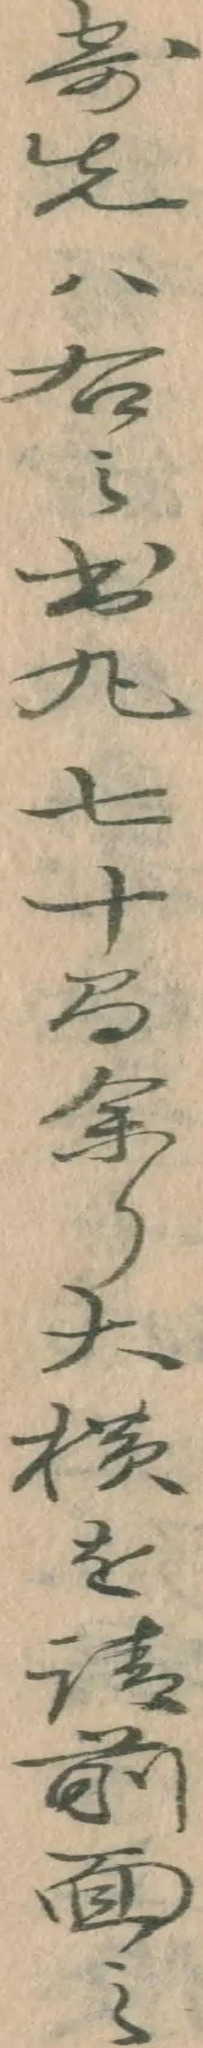寄先は右之出丸七十間余り大横を請前面之
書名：切支丹御退治記 49巻. [4]
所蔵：国立国会図書館 National Diet Library, JAPAN
